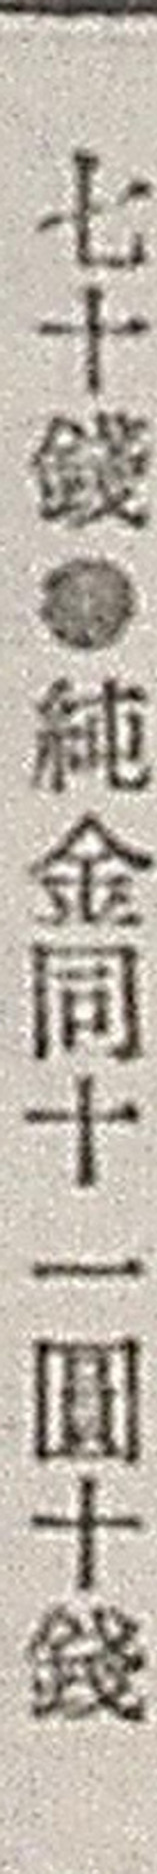七十銭●純金同十一円十銭
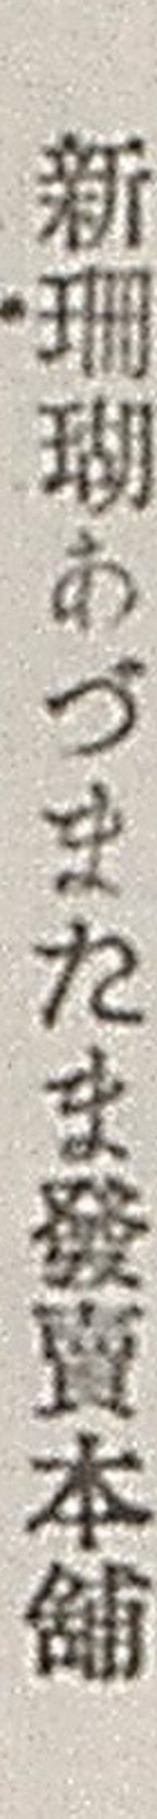上新珊瑚あづたま発売本舗
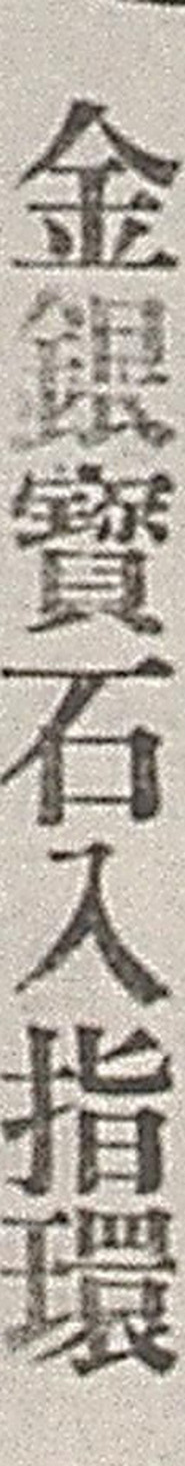金銀宝石入指輪
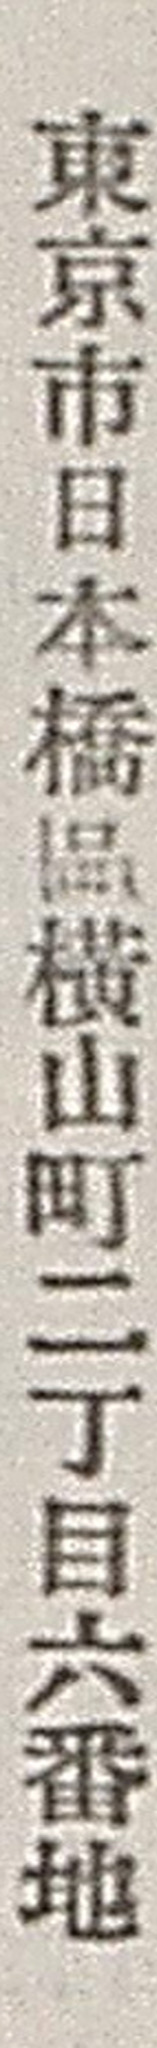東京市日本橋區横山町二丁目六番地
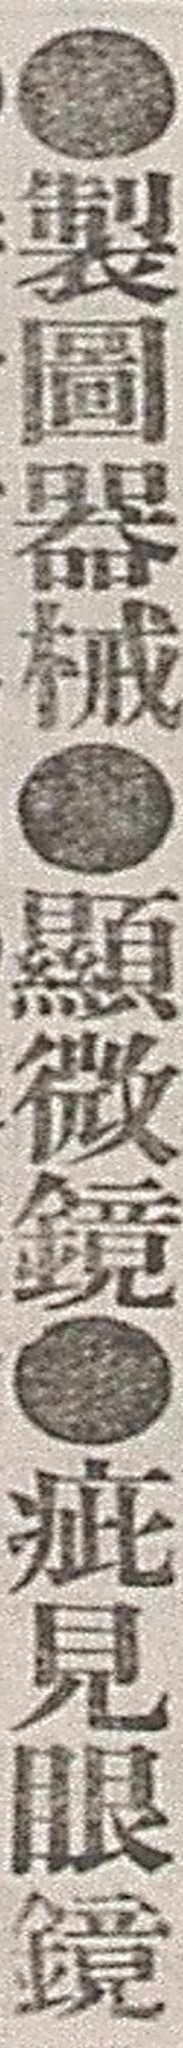●製図機械●顕微鏡●疵見眼鏡
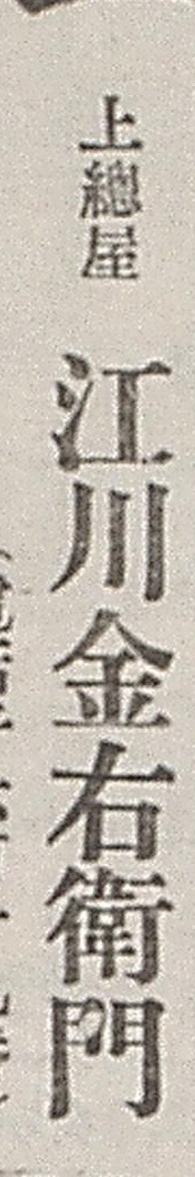上総屋江川金右衛門
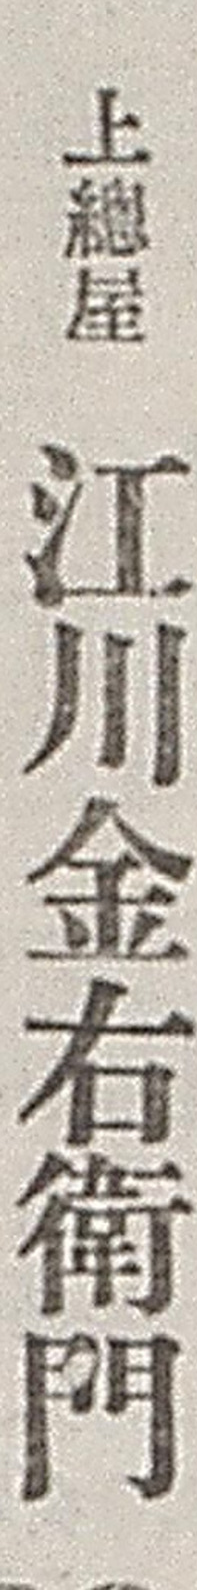上総屋江川金右衛門
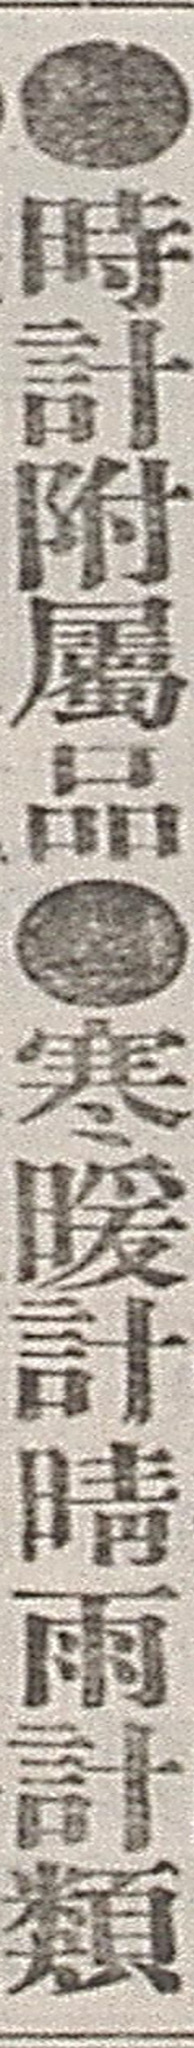●時計附属品●寒暖計晴雨計類
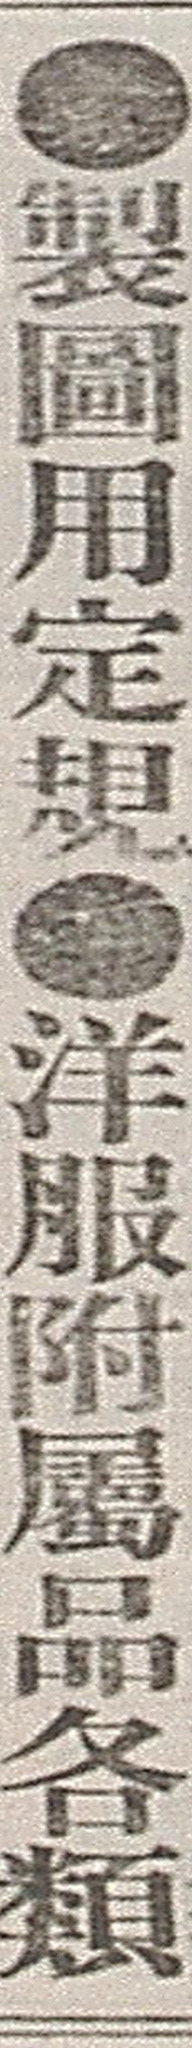●製図用定規●洋服附属品各類
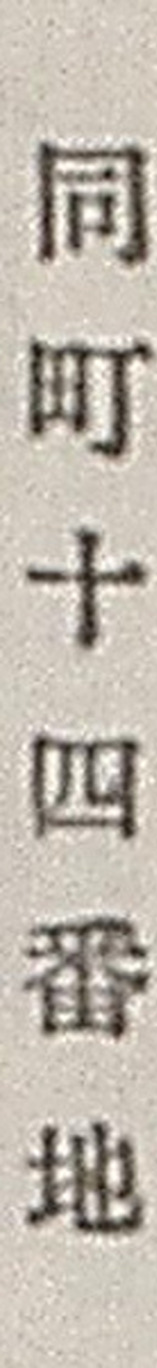同町十四番地
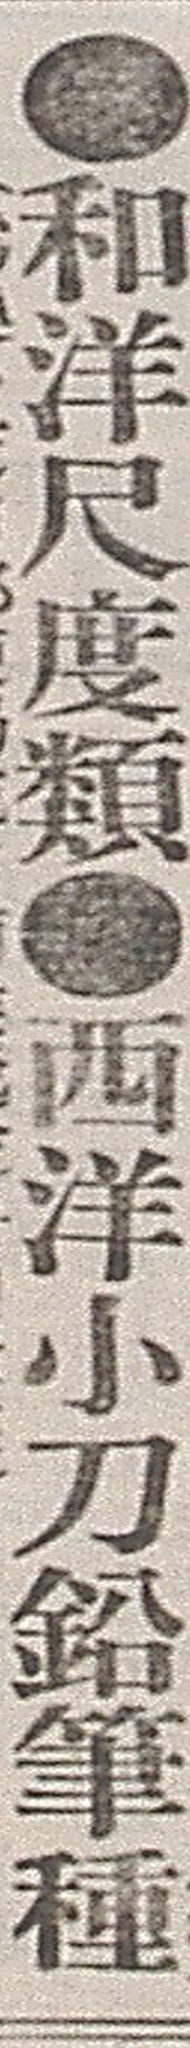●和洋尺度類●西洋小刀鉛筆種
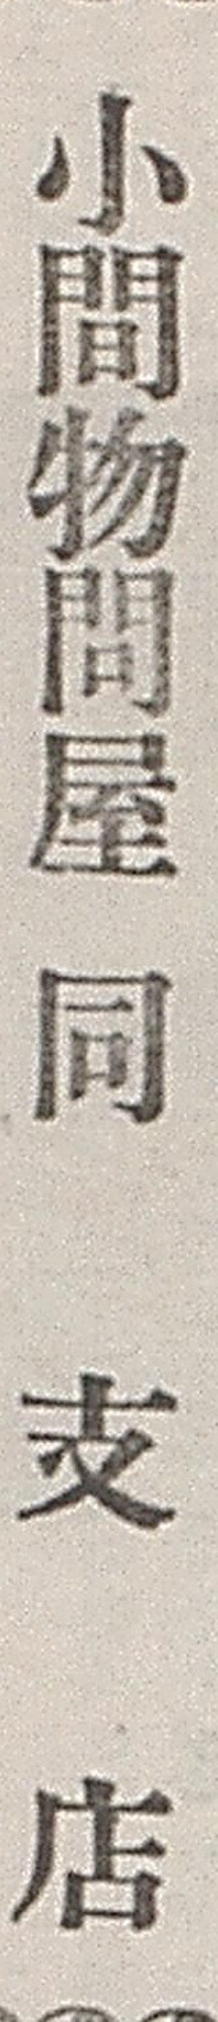小間物屋同支店
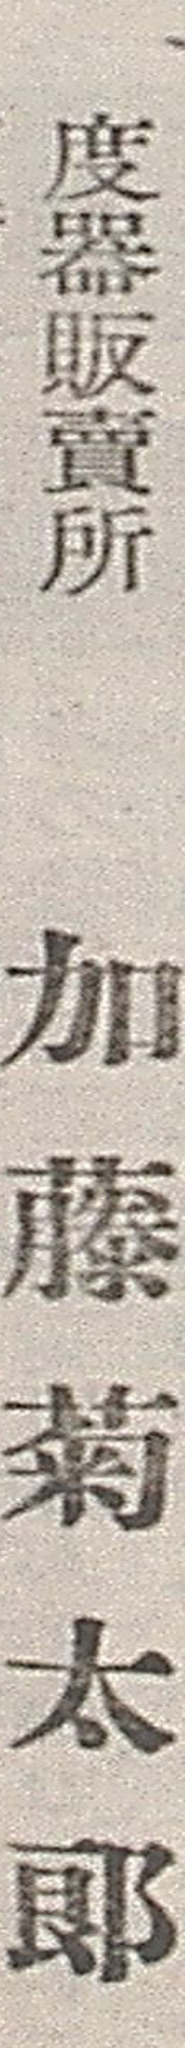度器販売所加藤菊太郎
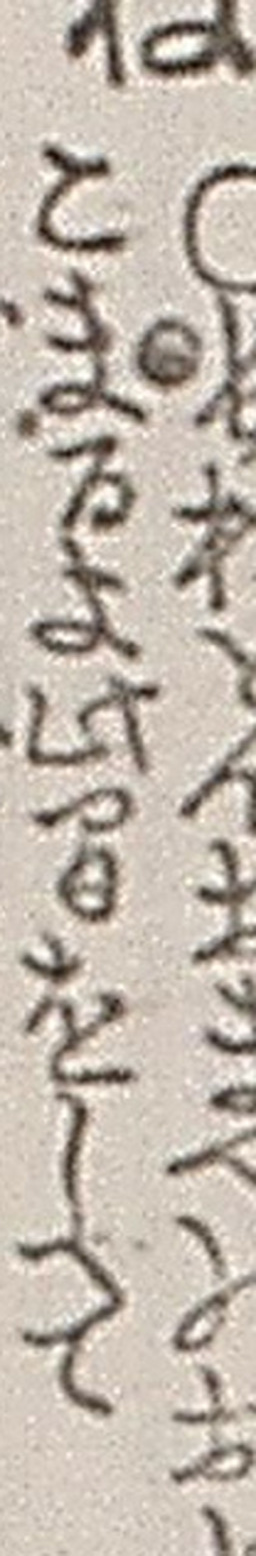こまるよ此間をしへて
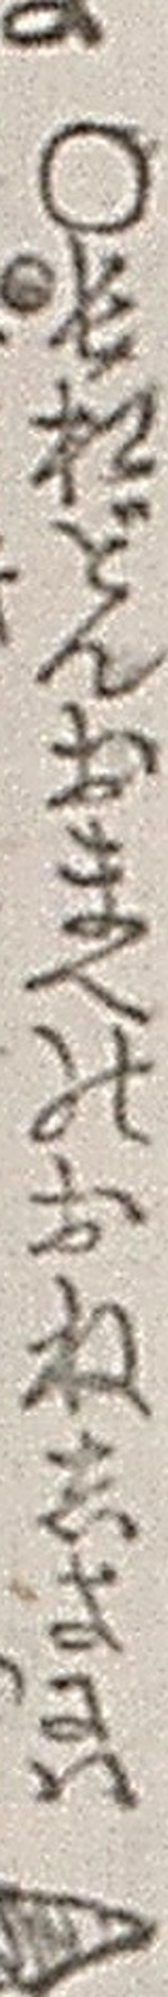◯長松どんおまへのおねしよには
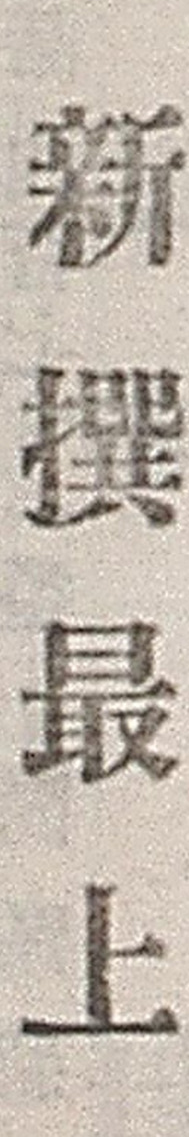新選最上
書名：風俗畫報臨時増刊第百二十六號　洪水被害録（中）
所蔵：東京大学地震研究所図書室 Earthquake Research Institute Library, The University of Tokyo, JAPAN
